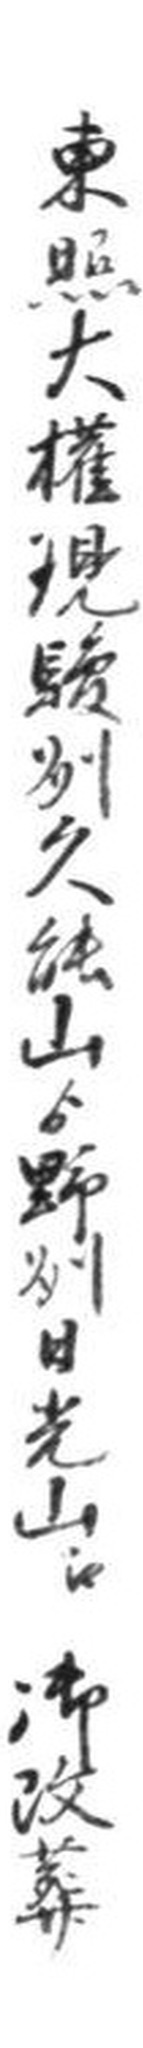東照大権現駿州久能山ゟ野州日光山江御改葬
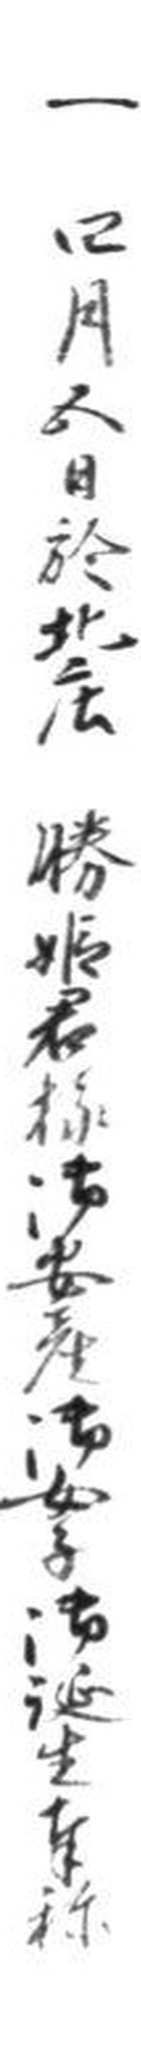一四月五日於北庄勝姫君様御安産御女子御誕生奉称
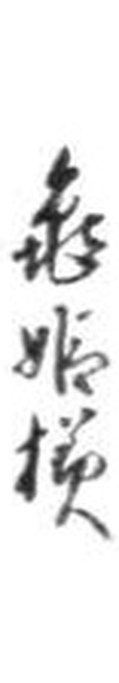亀姫様
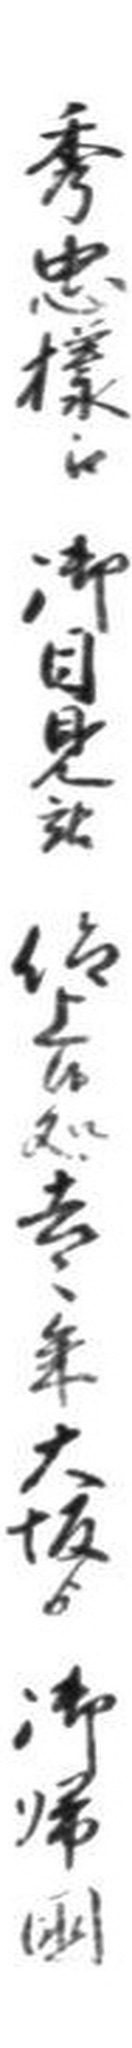秀忠様江御目見被仰上候処去々年大坂ゟ御帰国
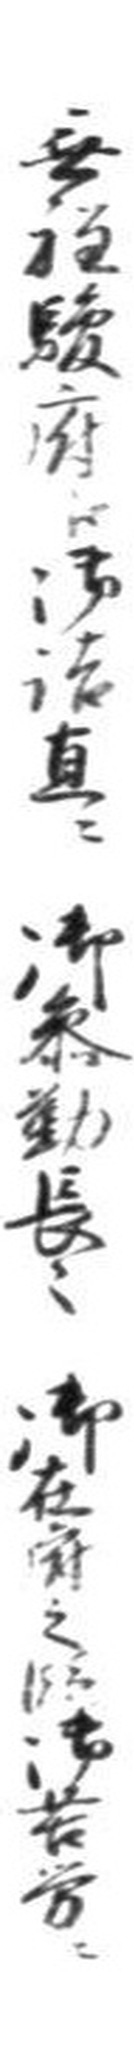無程駿府江御詰直ニ御参勤長々御在府之段御苦労ニ
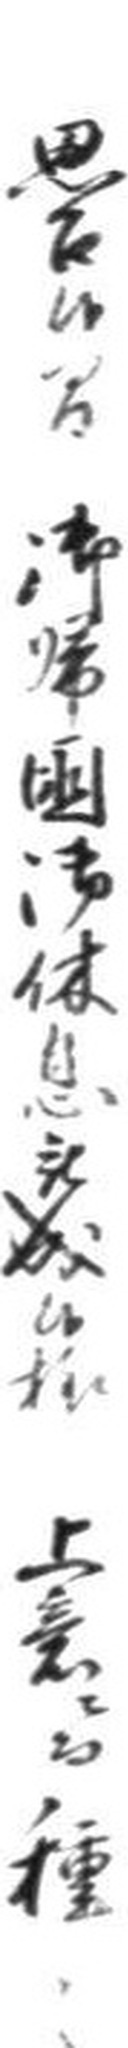思召候間御帰国御休息被成候様上意ニ而種々
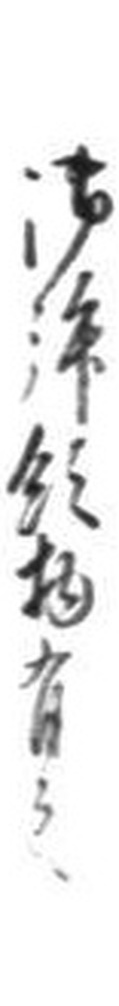御拝領物有之
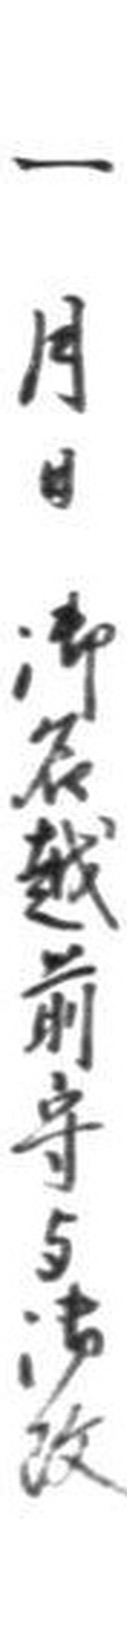一月日御名越前守与御改
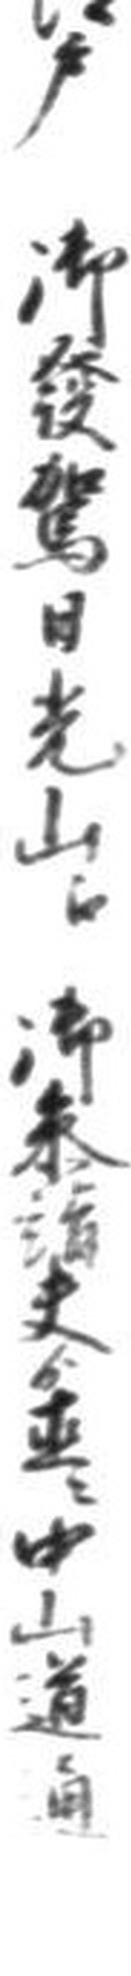詳江戸御発駕日光山江御参詣夫ゟ直ニ中山道通
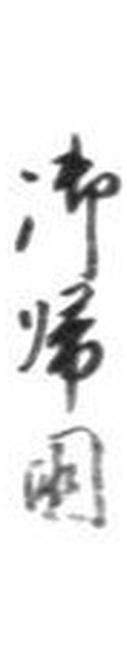御帰国
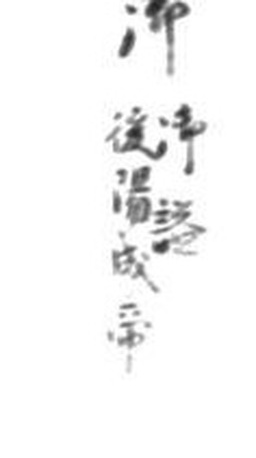後陽成帝

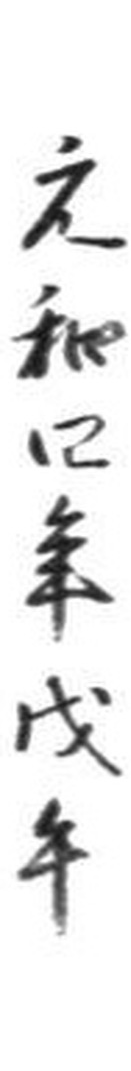元和四年戊午
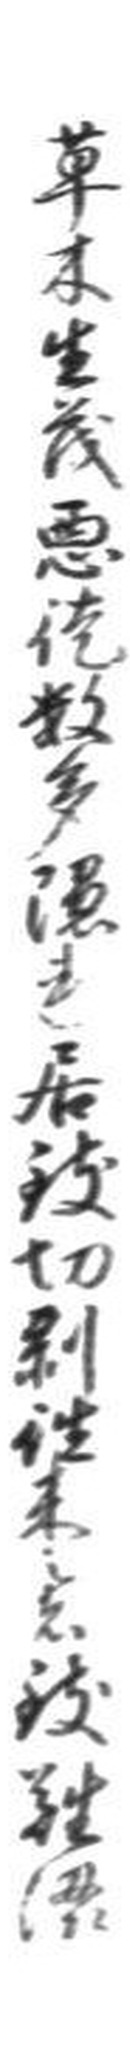草木生茂悪徒数多隠れ居致切剥往来之者致難渋
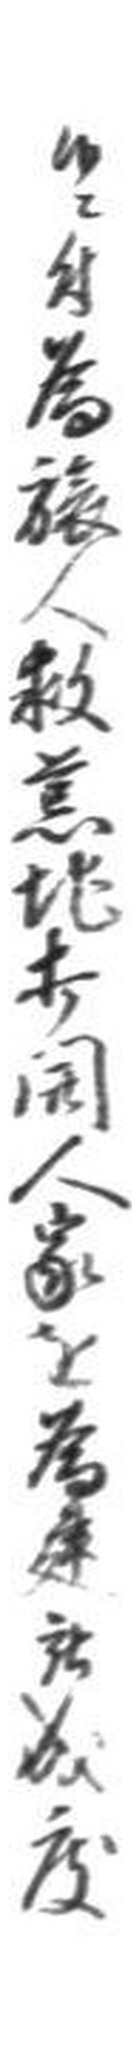候ニ付為旅人救荒知地打開人家を為建被成度
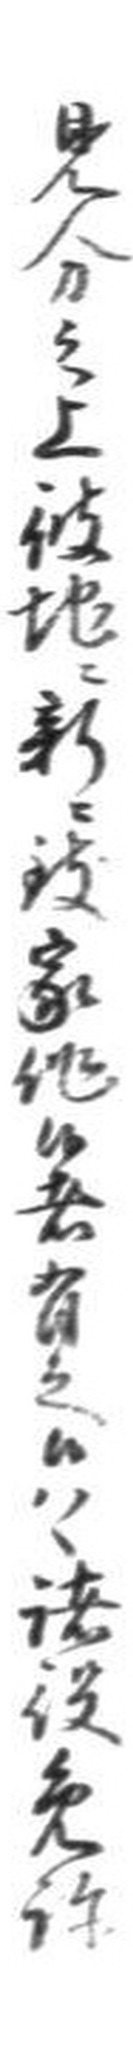見分之上彼地ニ新ニ致家作候者有之候ハヽ諸役免許

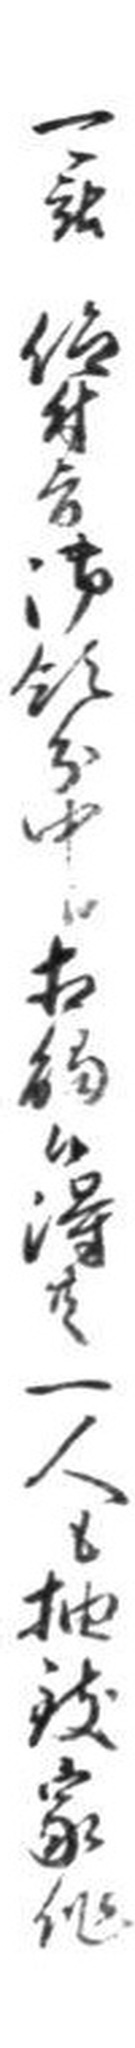可被仰付旨御領分中江相触候得共一人も抽致家作
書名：家譜 二 忠直公 従文禄四年到慶安四年
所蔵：福井県文書館 Fukui Prefectural Archives
